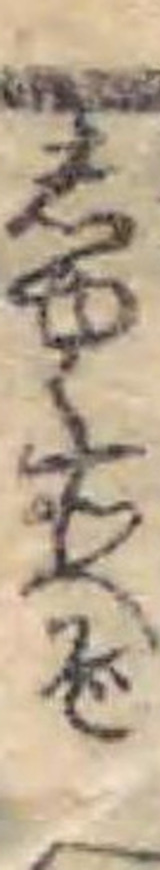しゆく所へぞ
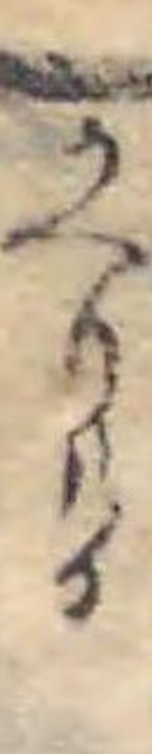かへりける
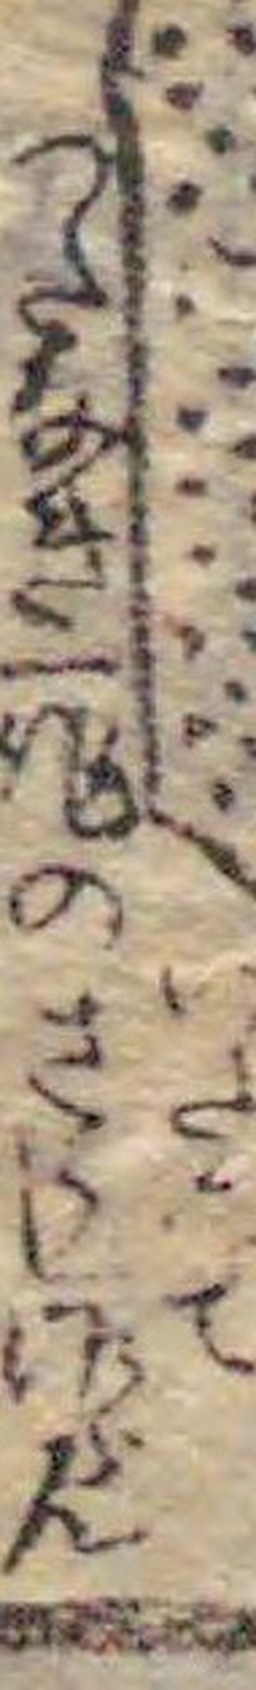つたなき一作のさうし御らん
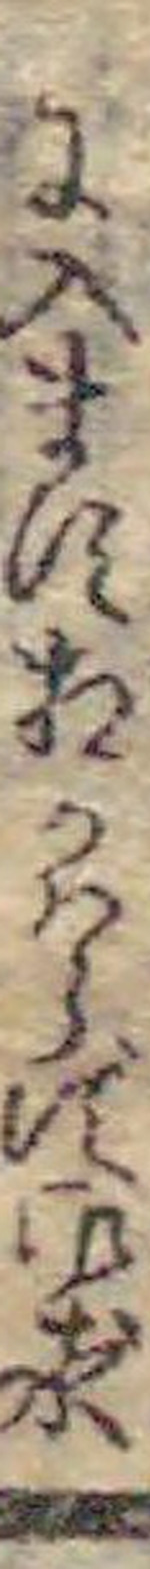い入ます相かはらず御求
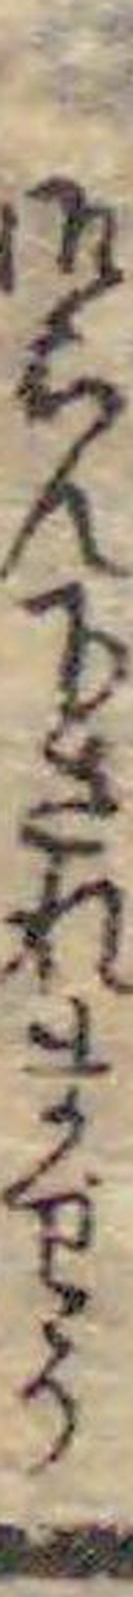御らん下されませう
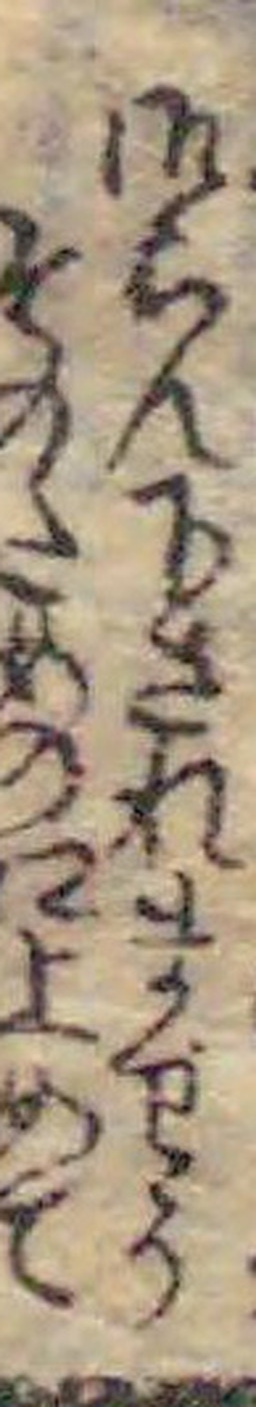そのための口上めて
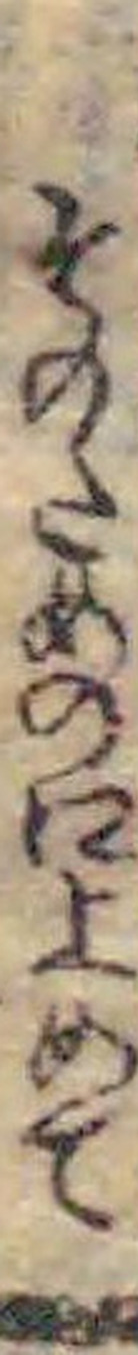そのための口上めて
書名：身体開帳略縁起 : 3巻
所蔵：国立国会図書館 National Diet Library, JAPAN
